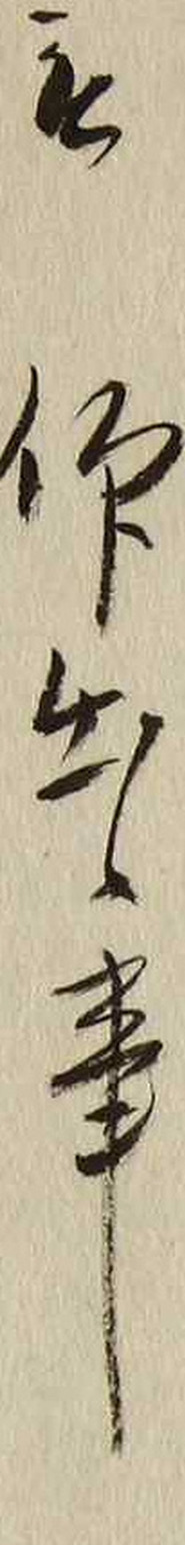被仰出候事
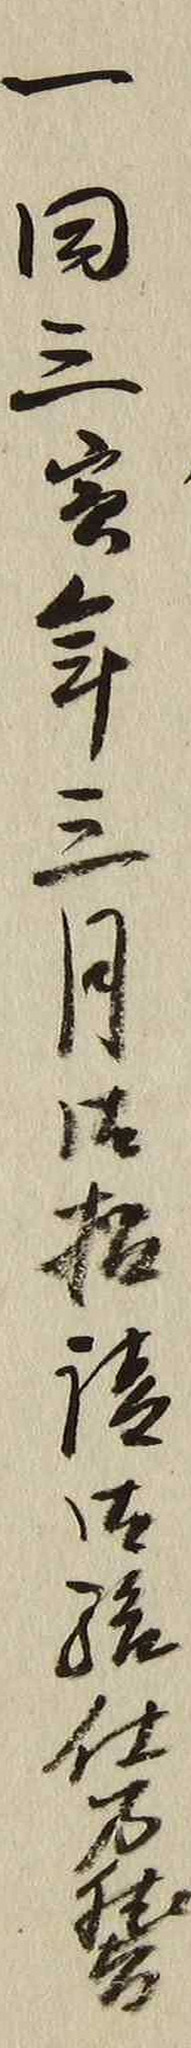一同三寅年三月御招請御給仕方稽
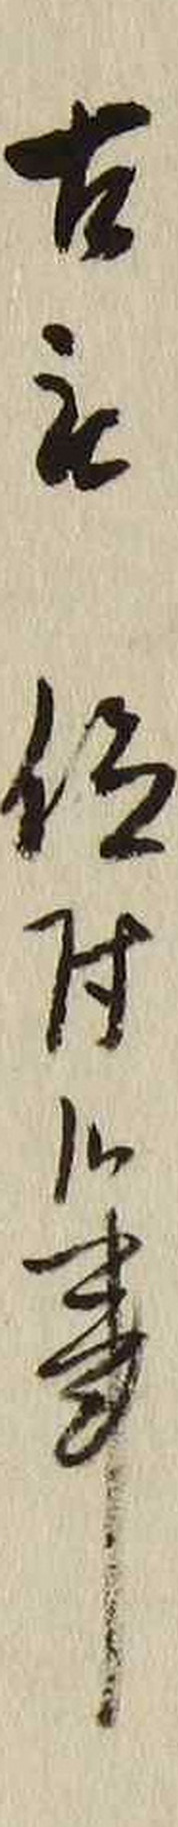古被仰付候事
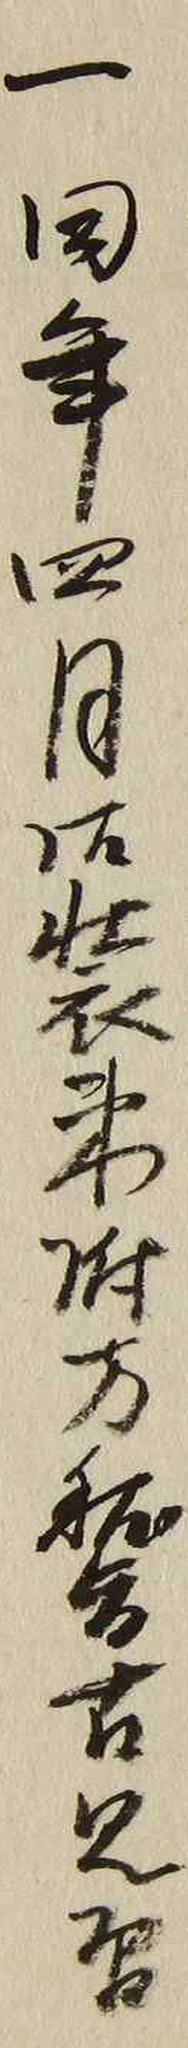一同年四月御装束附方稽古見習
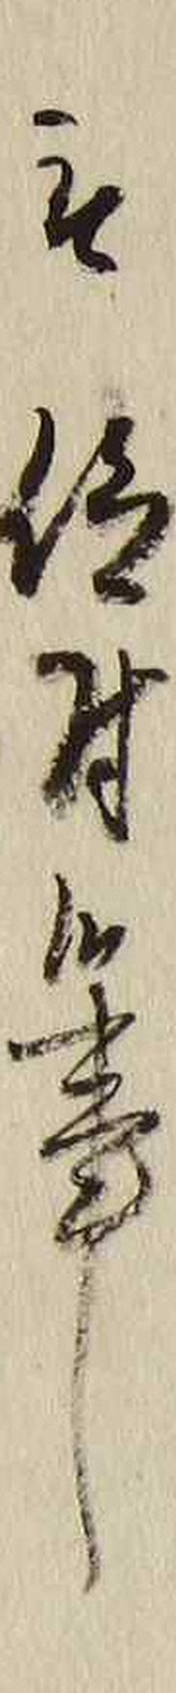被仰付候事
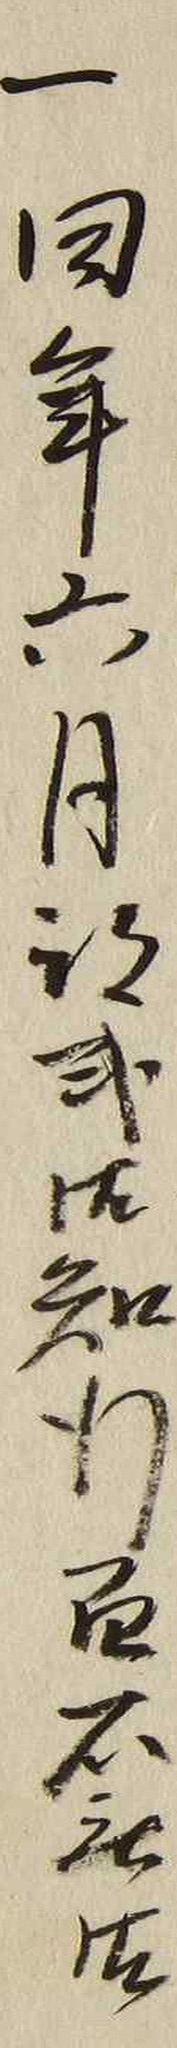一同年六月跡式御知行百石無御

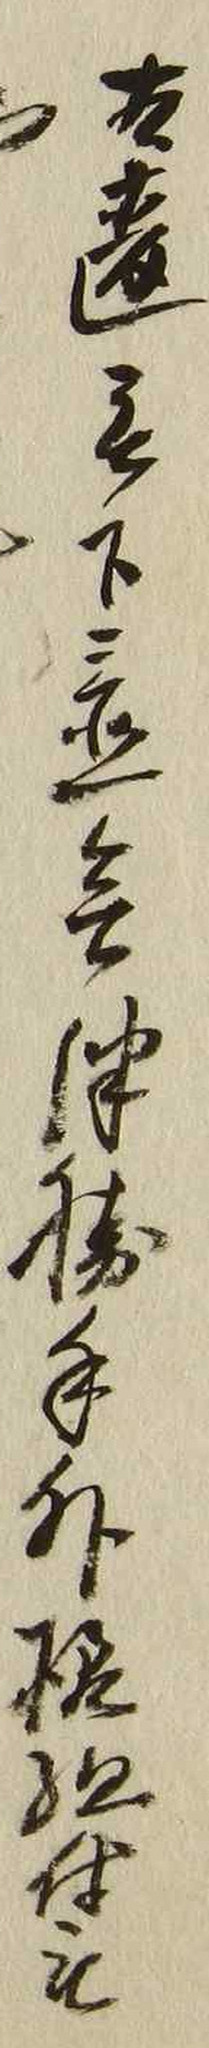相違被下置会津勝手外様組付被
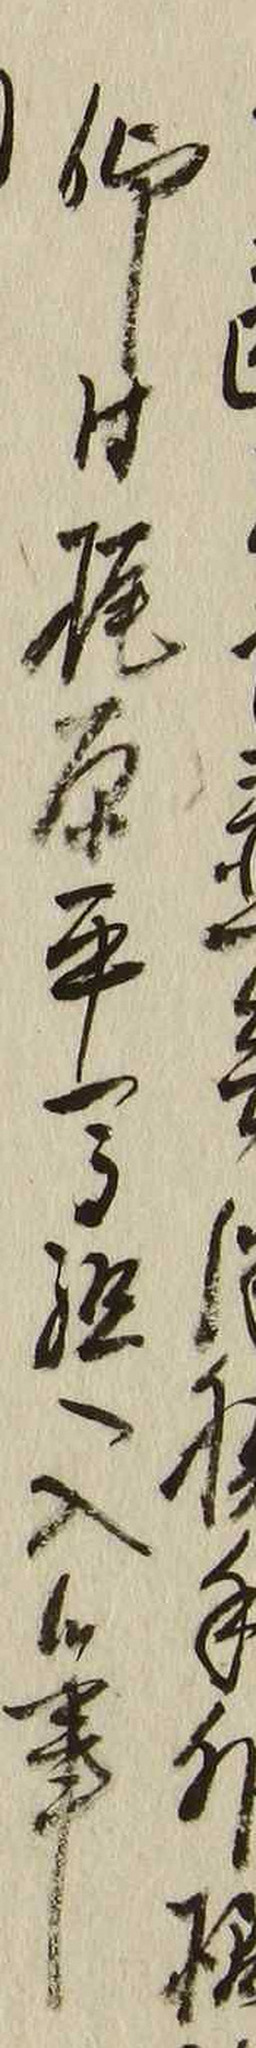仰付梶原平馬組筆へ入候事
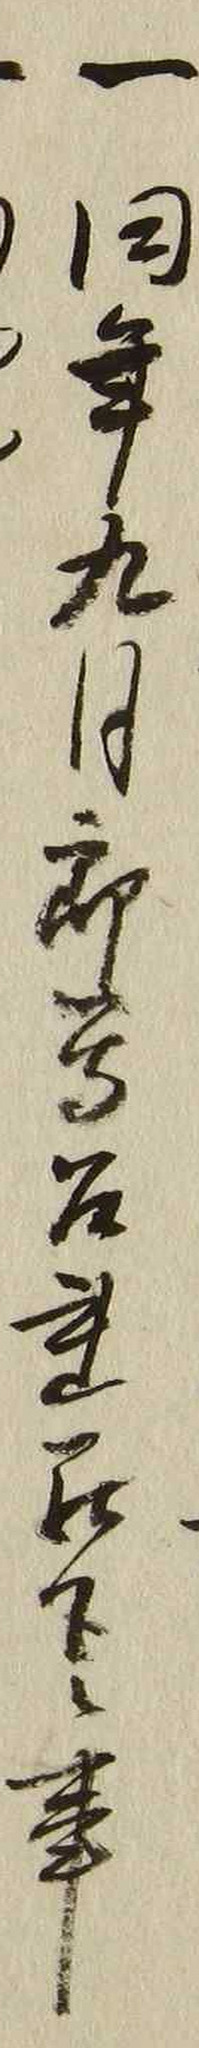一同年九月郎等召連罷下候事
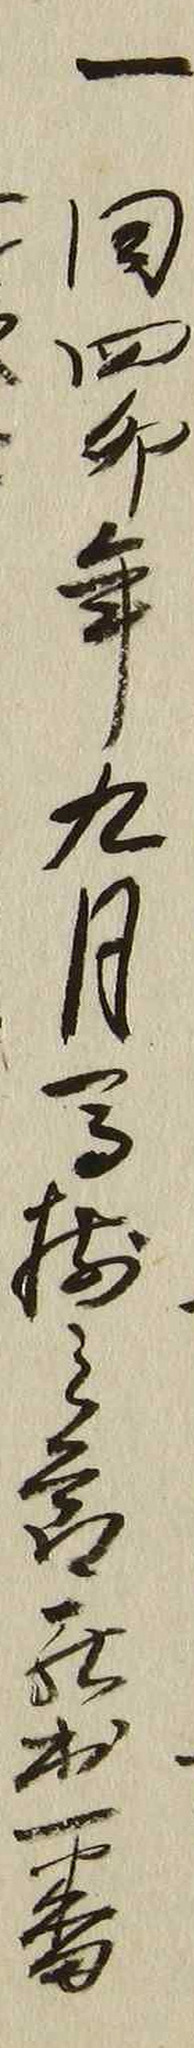一同四卯年九月馬揃之節罷出一番
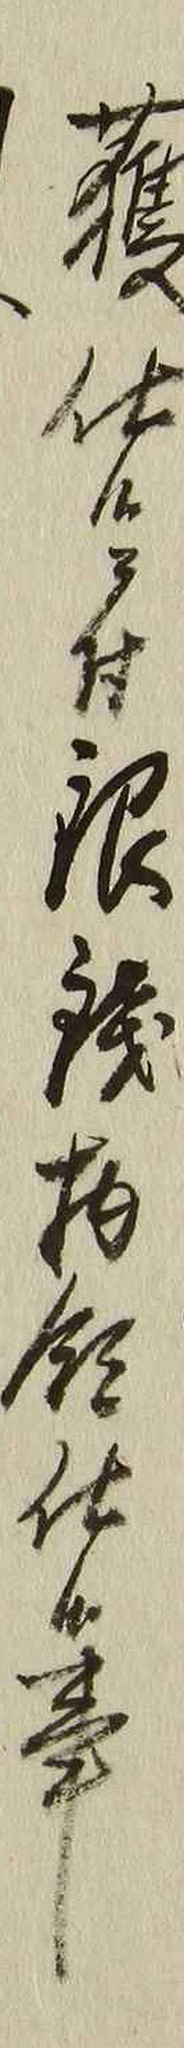獲仕候ニ付銀銭拝領仕候事
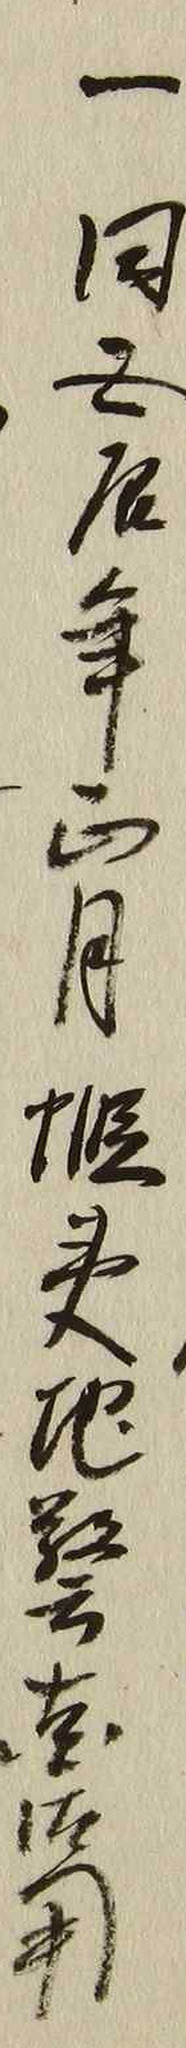一同五辰年正月蝦夷地警固御用
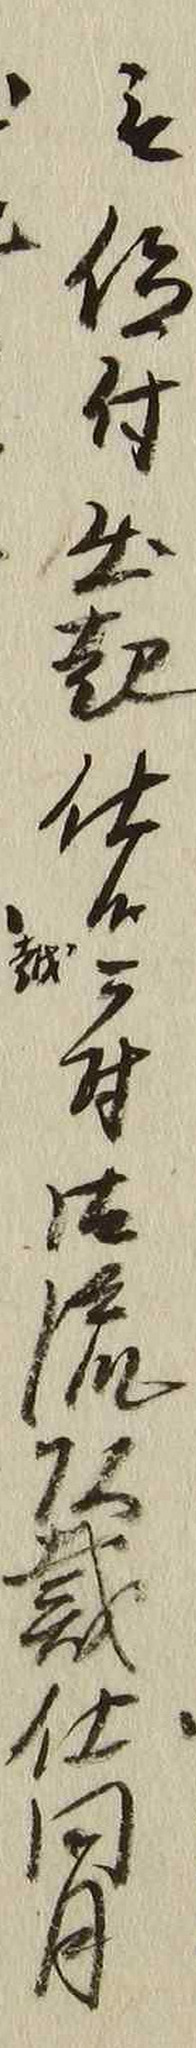被仰付出起仕候ニ付御流頂戴仕同月
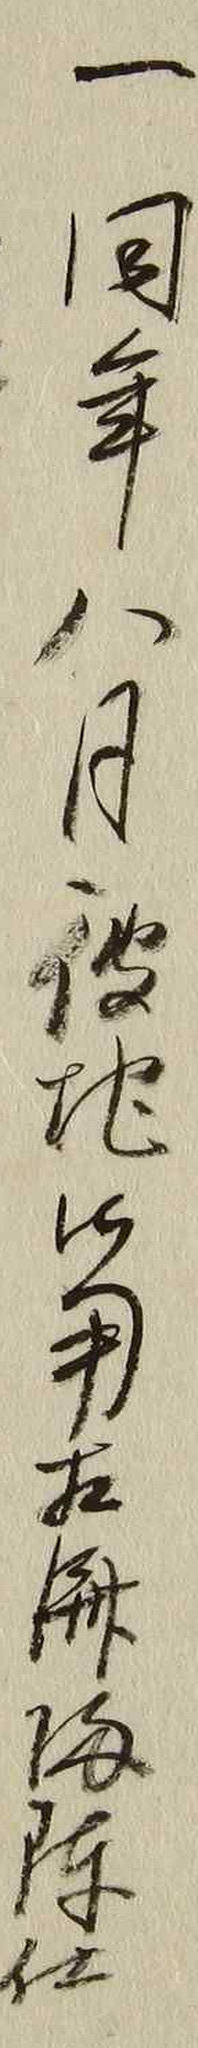一同年八月彼地御用相済備陣仕
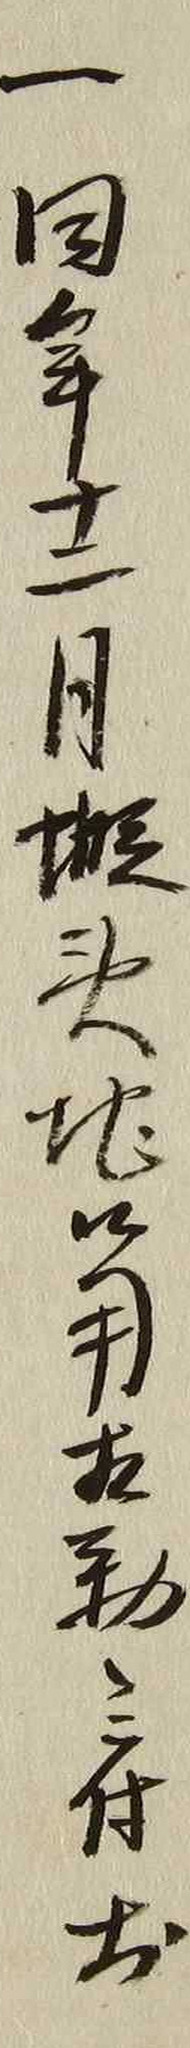一同年十二月蝦夷地御用相勤候ニ付於
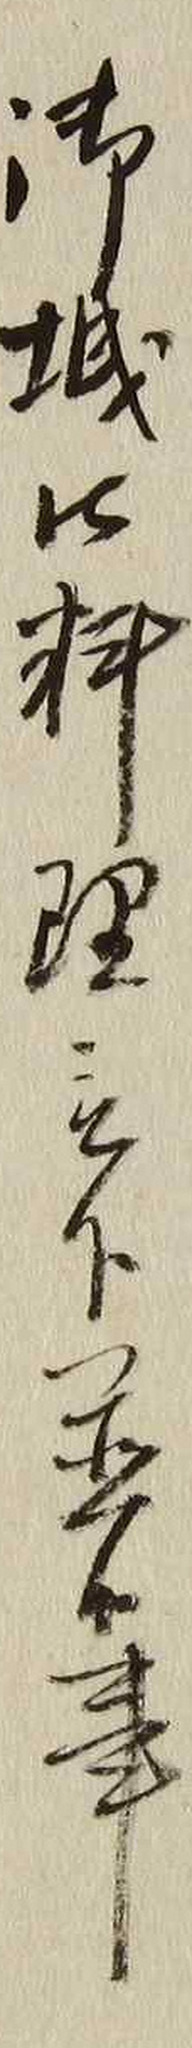御城御料理被下置候事
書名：諸士系譜　巻之349　も之部5
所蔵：会津若松市立会津図書館
